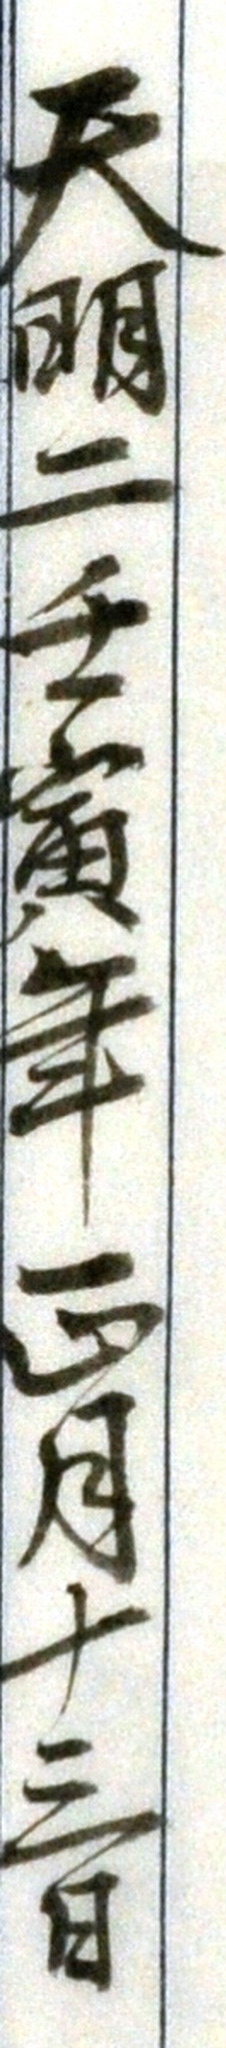天明二壬寅年正月十三日
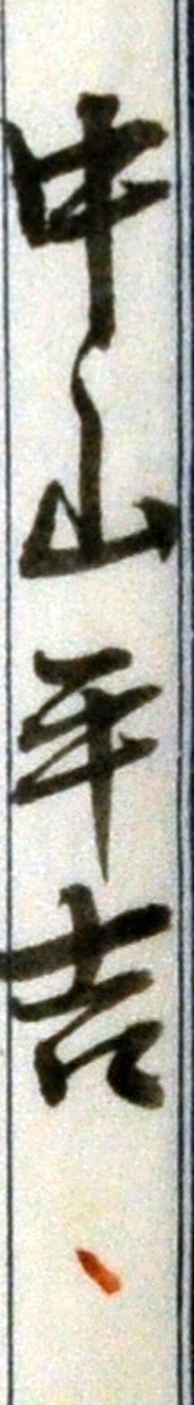中山平吉
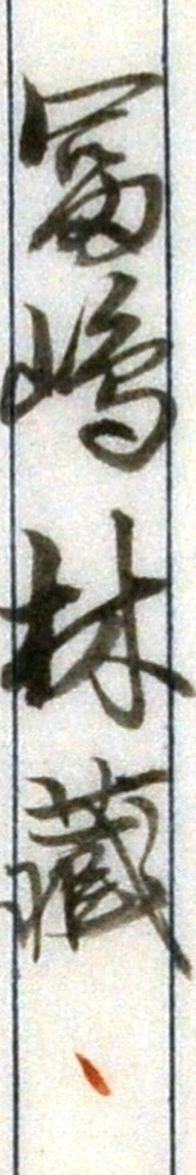冨嶋林蔵
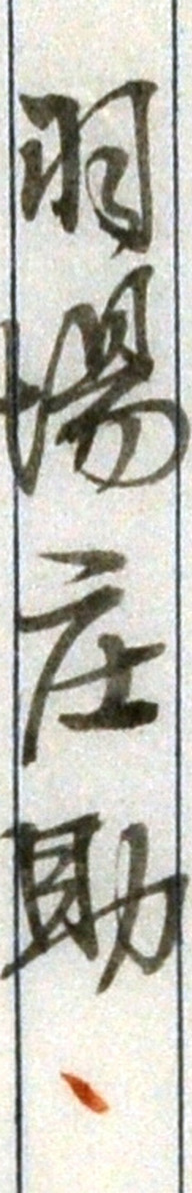羽場庄助
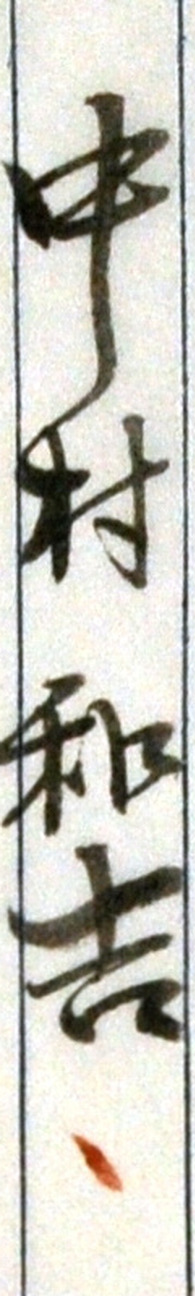中村和吉
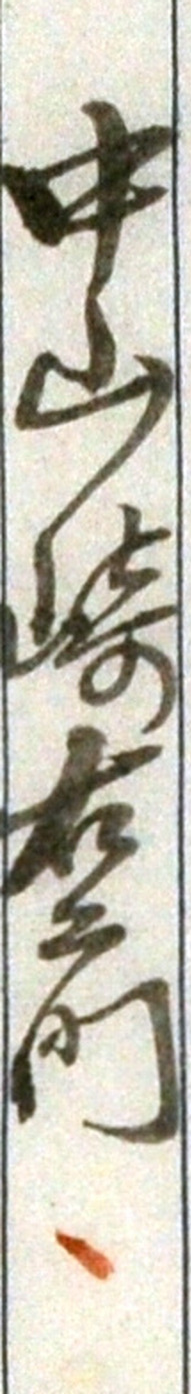中山碕右エ門
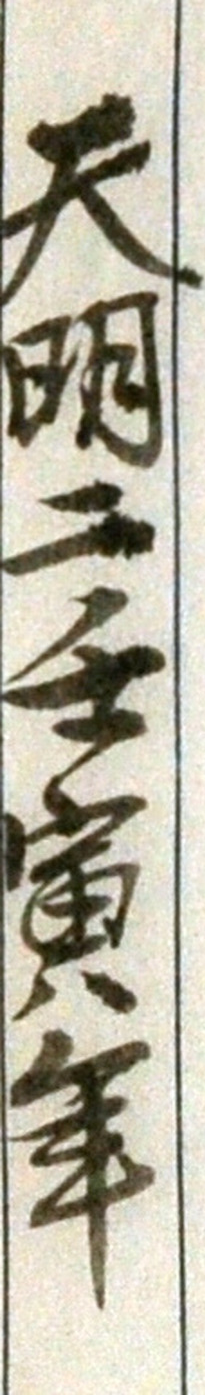天明二壬寅年

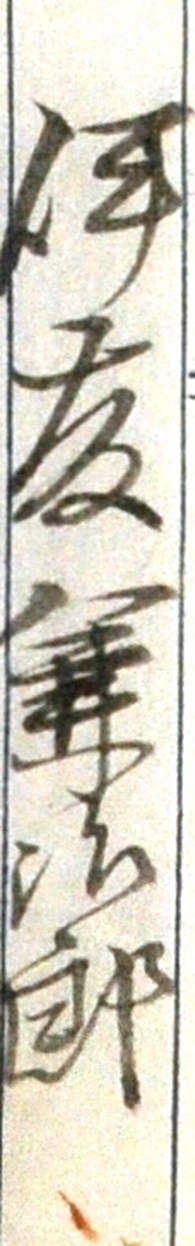伊藤兼治郎
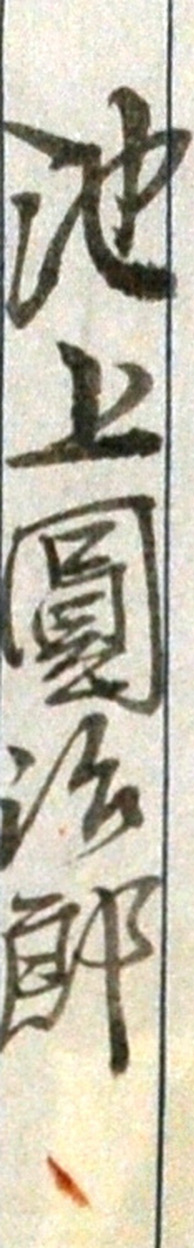池上円治郎
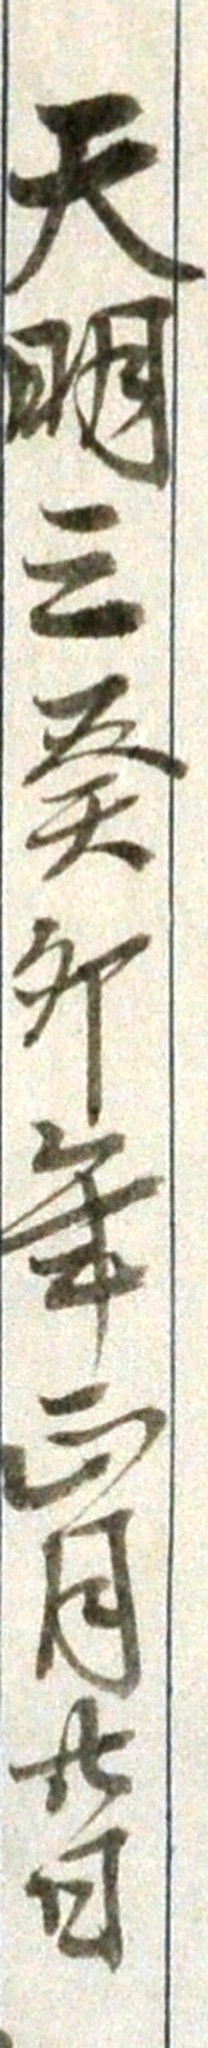天明三癸卯年正月廿日
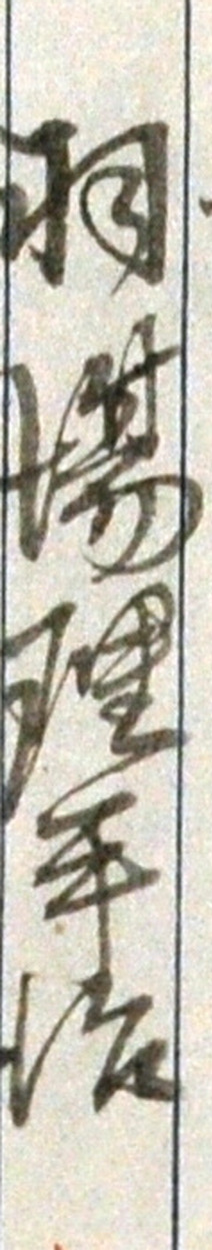羽場理平治
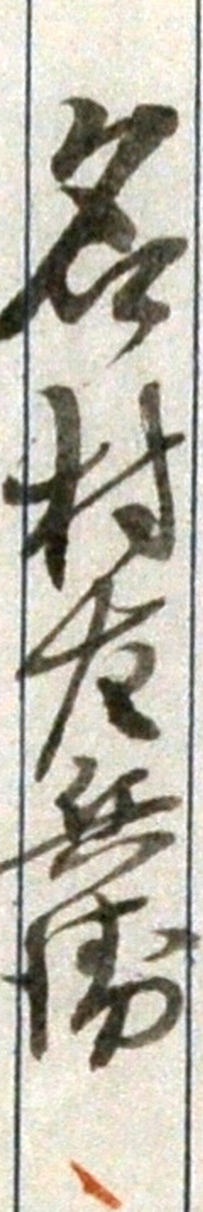名村左兵衛
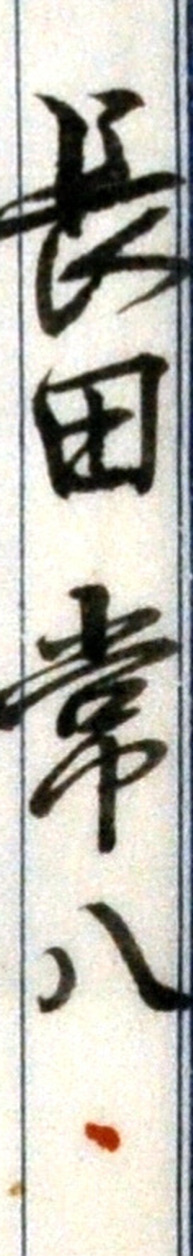長田常八
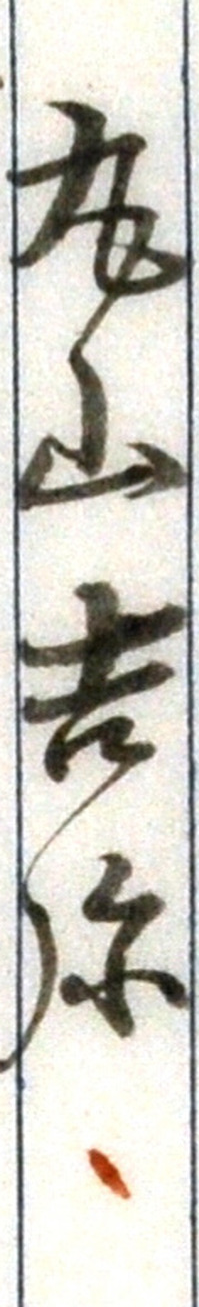丸山吉弥
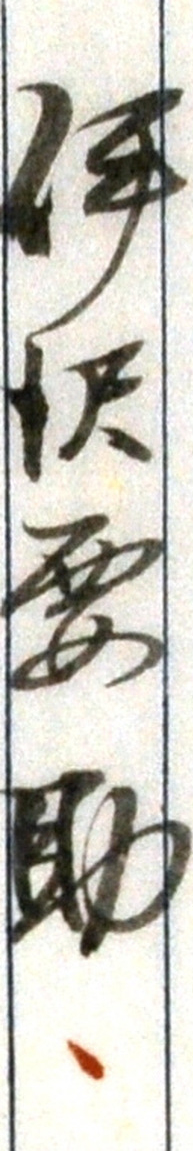伊沢要助
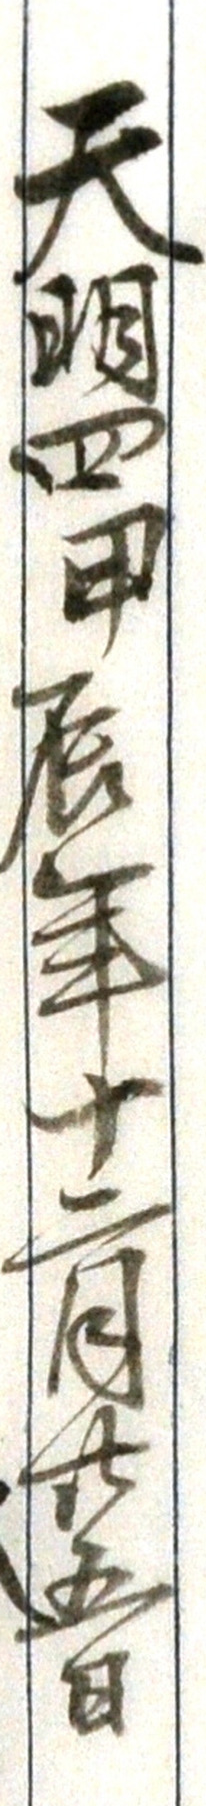天明四甲辰年十二月廿五日
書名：竹内流・甲州流・荒木流・一刀流新当流起請文及免許写堤宝山流手鏡及個之大事
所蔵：伊那市立高遠町図書館・合同会社AMANE
